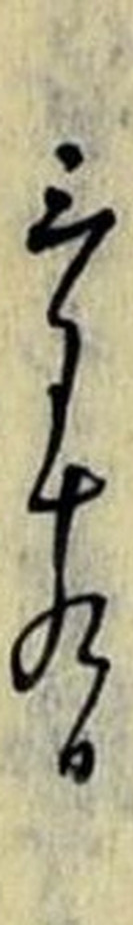三月十九日
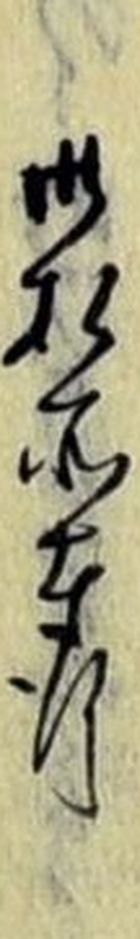御札所奉行
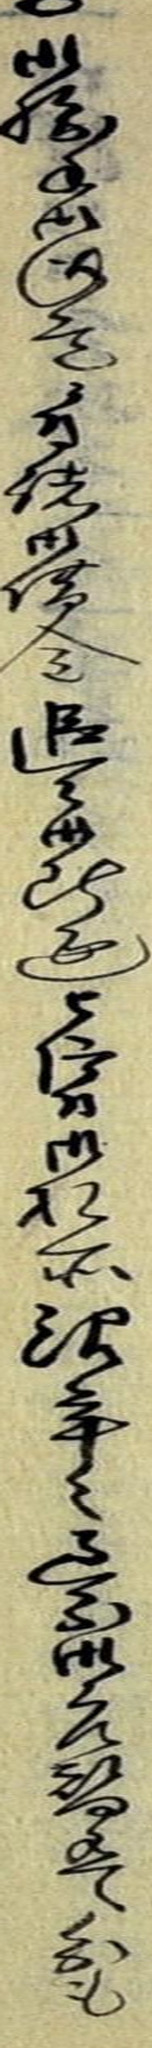〇御勝手御趣意ニ付諸御借金追々御断延被仰付御札所銀年々過分御取替有之分も
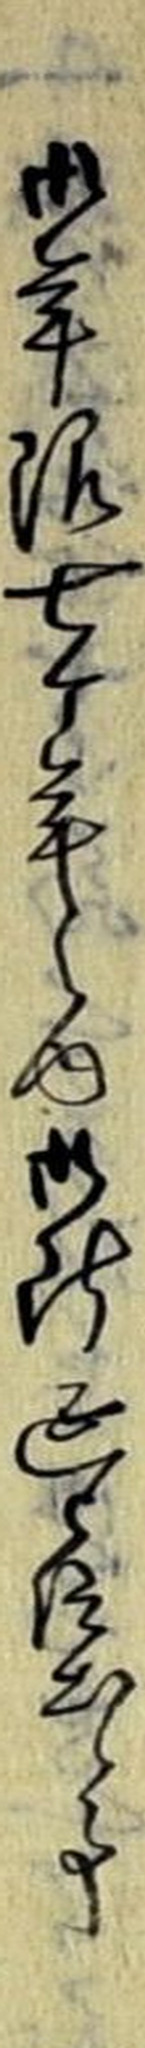御年限七ケ年之内御断延被仰出候事
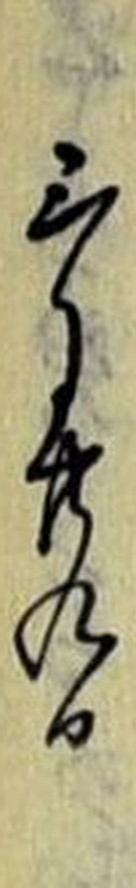三月廿九日
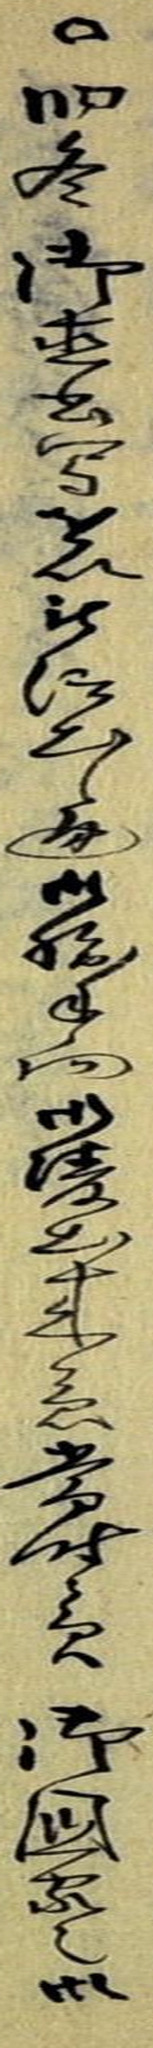〇旧冬御直書写を以被仰出候通御勝手向御凌出来兼当時ニ而ハ御国家之御
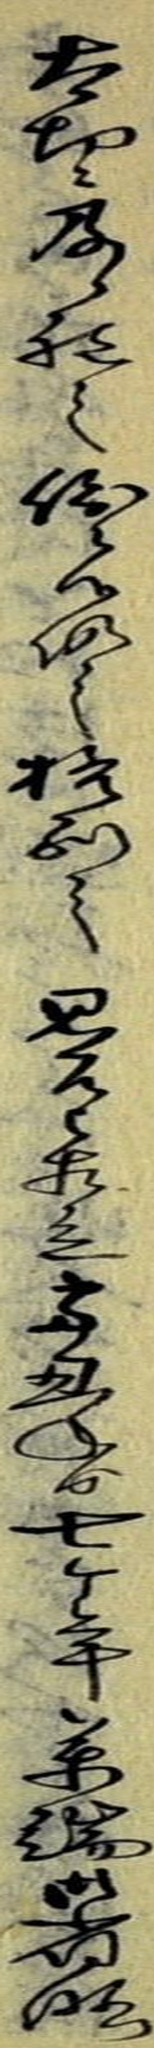太切ニ及候程之儀ニ候仍之格別之思召被相立当丑年ゟ七ケ年万端御省略
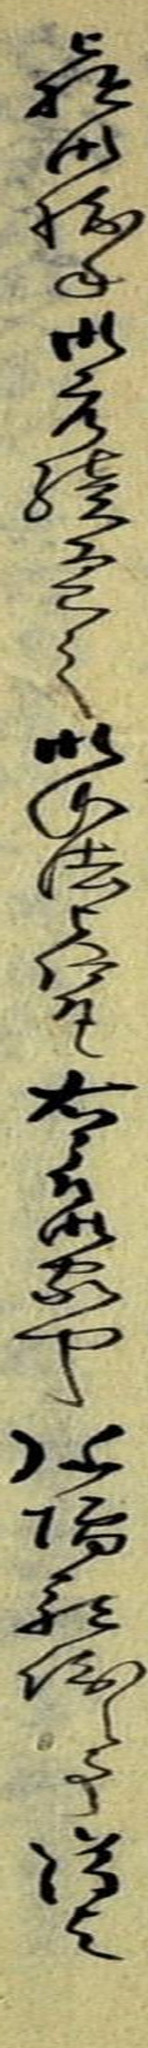被遊御勝手御取続而已之御趣法被仰付候右ニ付御家中弥増難儀之事得与
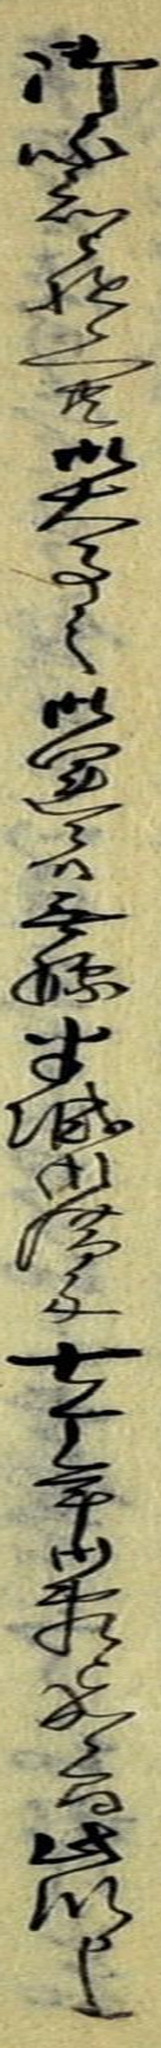御承知被遊候へ共御大事之御運ニ付無拠半減御借米七ケ年御頼被成候間此段申
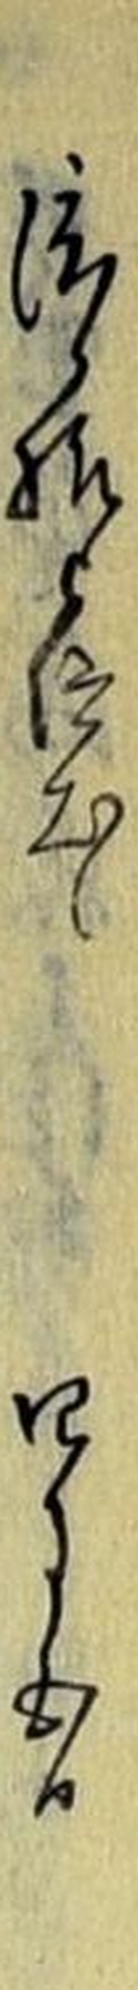渡候様被仰出候四月五日
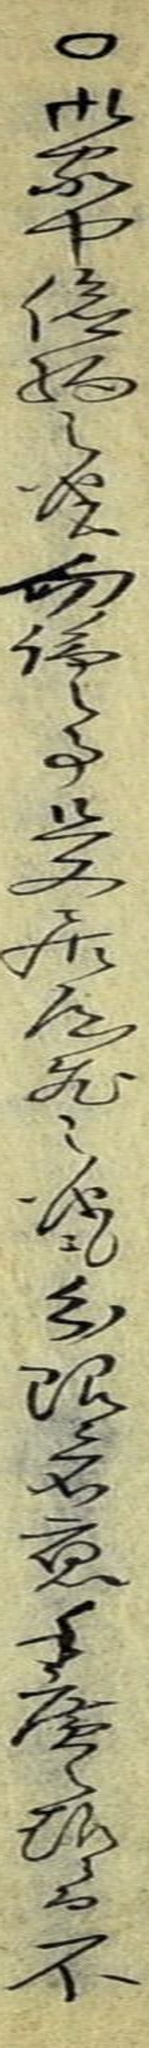〇御家中倹約之儀ハ勿論之事且又居屋敷之儀も分限ニ不応手広之趣ニ而不
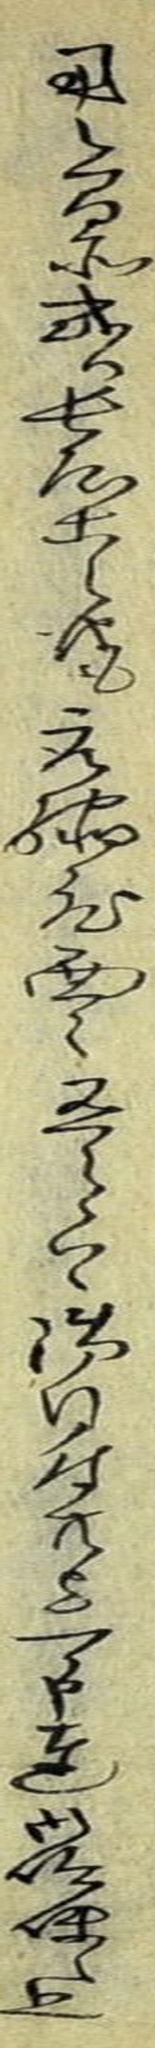用之間所或ハ長屋等之儀も取縮度面々有之候ハヽ御目付共迄可申達御吟味之上
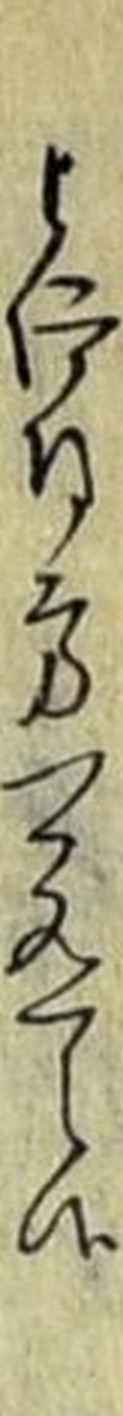被仰付方可有之候
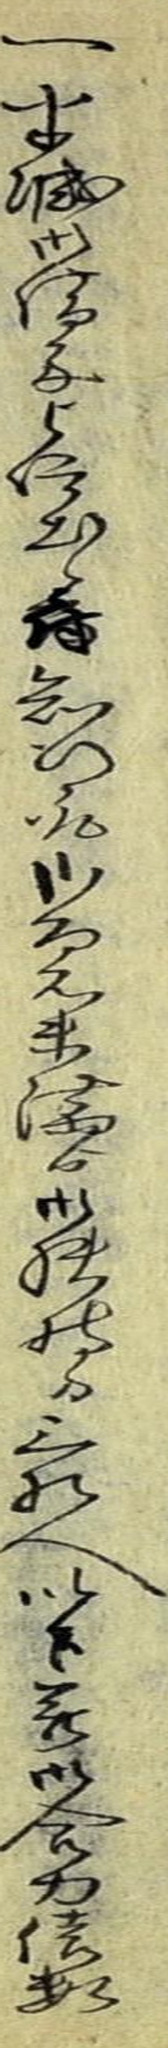一半減御借米被仰出候ニ付知行取弐百石未満ゟ御扶持方三拾人以下并御合力俵数
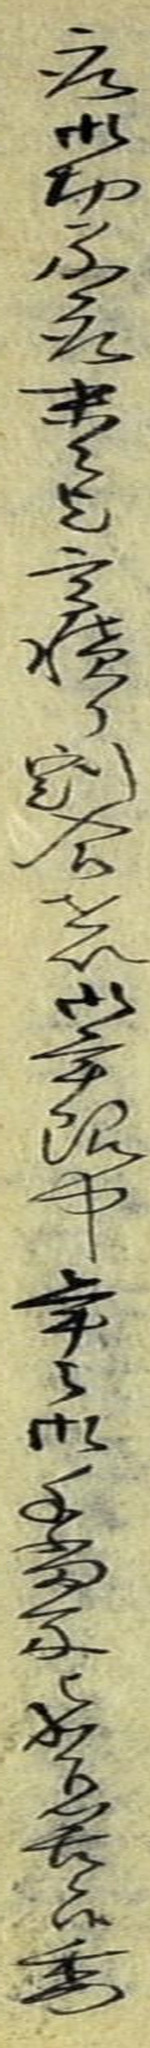取御切米取末々迄高積り割合を以御年限中年々御手当米被成下筈ニ候委
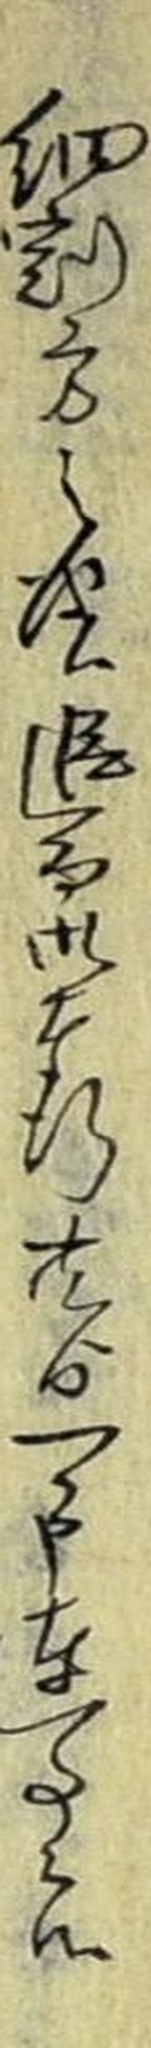細割方之儀ハ追而御奉行共ゟ可申達事ニ候
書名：命令之部 三
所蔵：福井県文書館 Fukui Prefectural Archives
